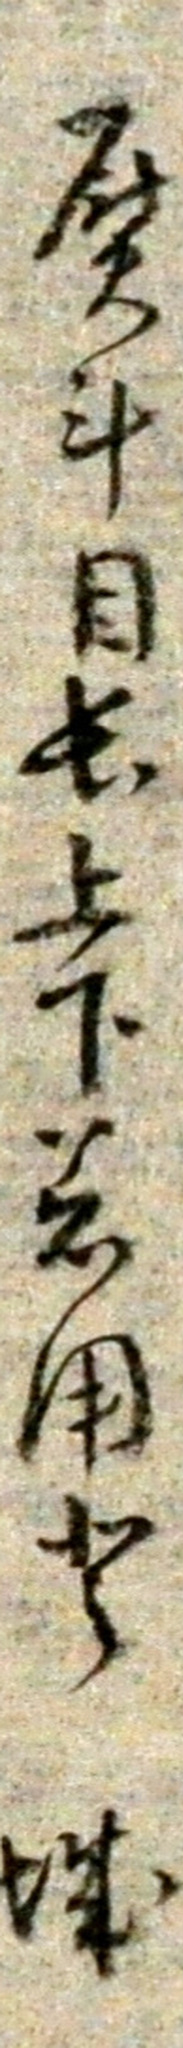熨斗目長上下着用登城
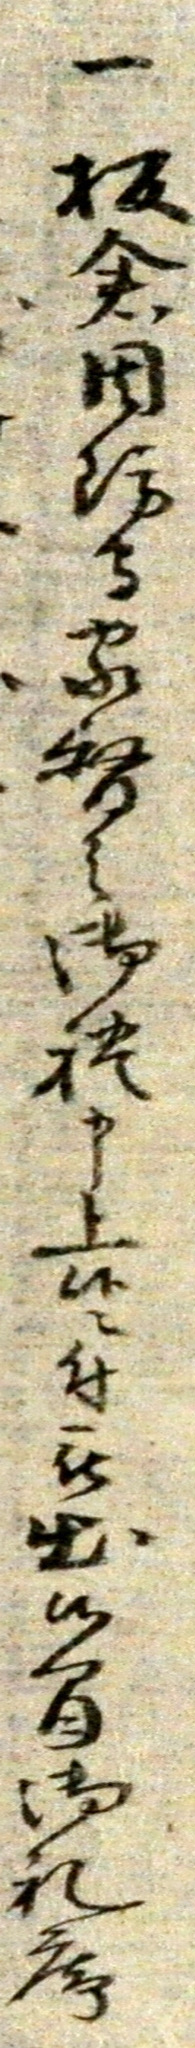一板倉周防守家督之御礼申上候ニ付被出候間御礼席
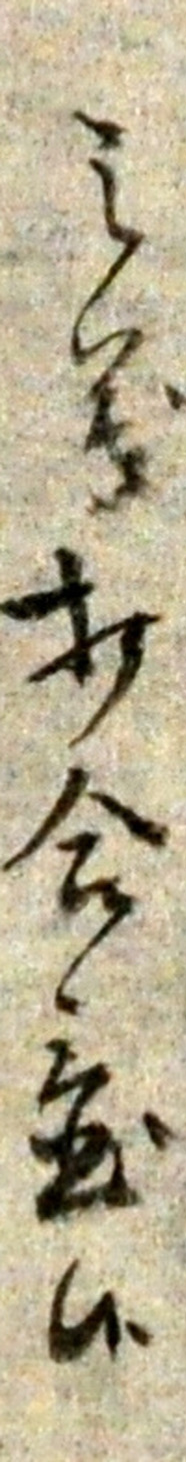之義打合置候
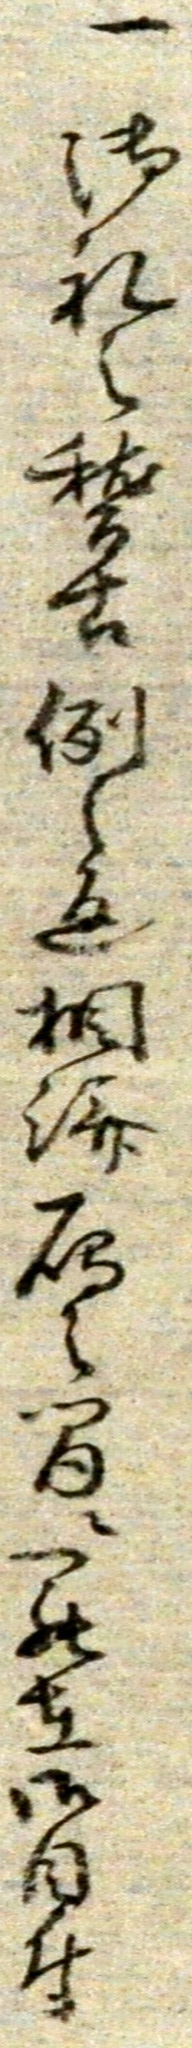一御礼之稽古例之通相済雁之間ニ罷在御目付
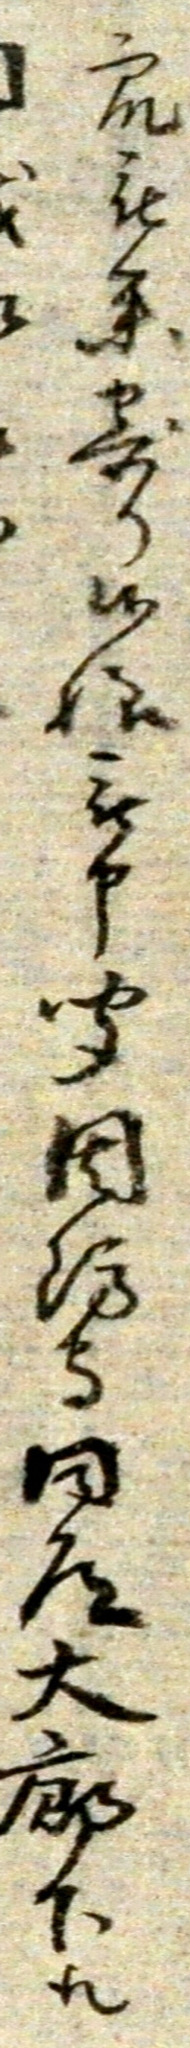衆被参寄り候様被申聞周防守同道大廊下え
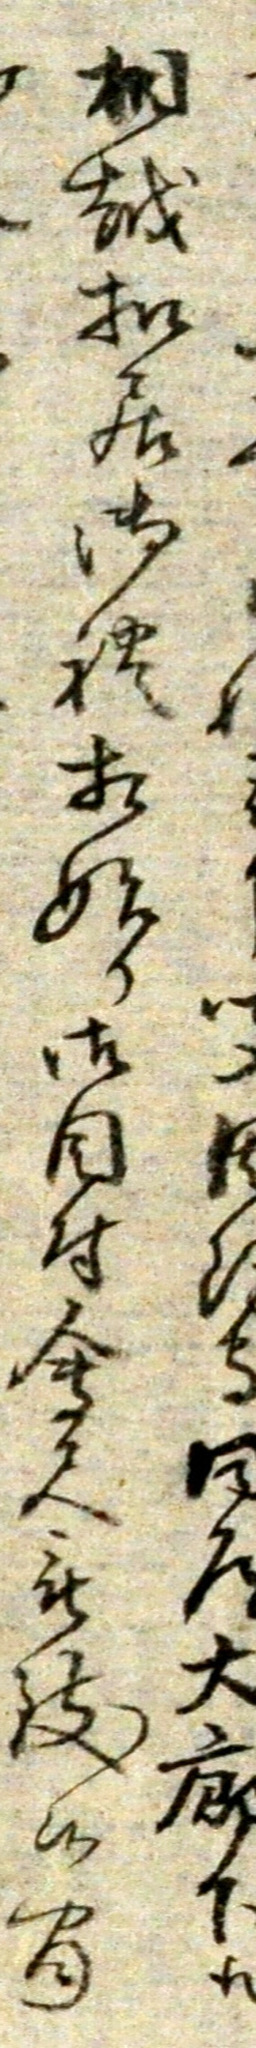相越扣居御礼相始り御目付会尺被致候間
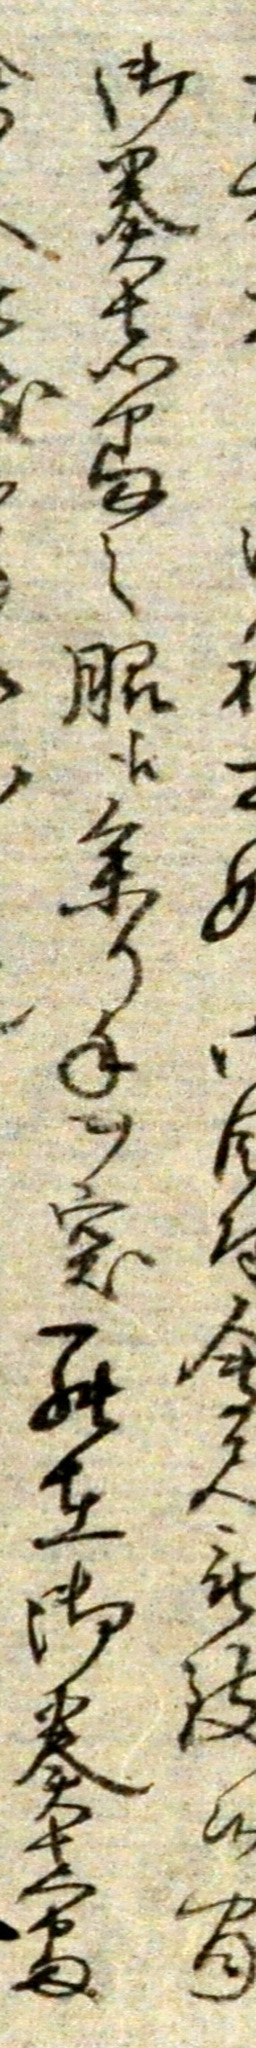御奏者番之脇え参り手ヲ突罷在御奏者番
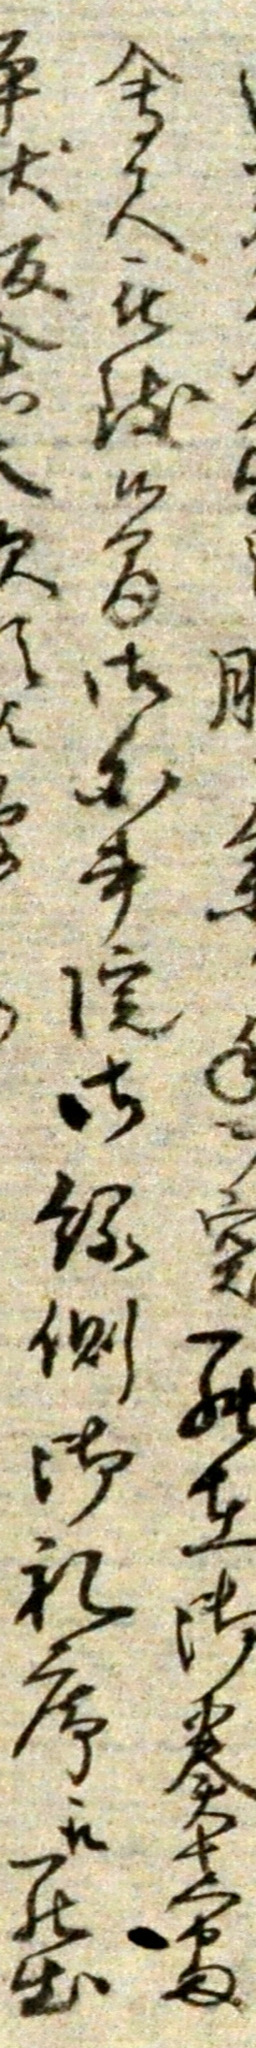会尺被致候間御白書院御縁側御礼席え罷出
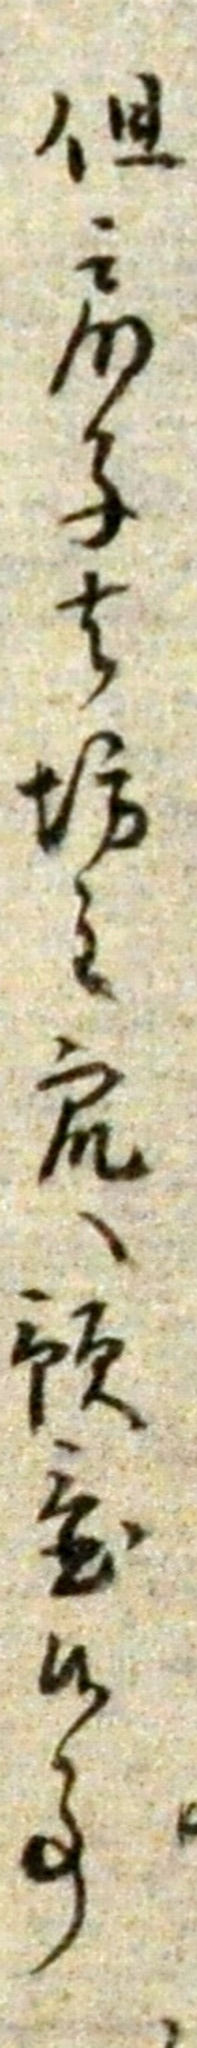但扇子は坊主衆ヘ預置候事
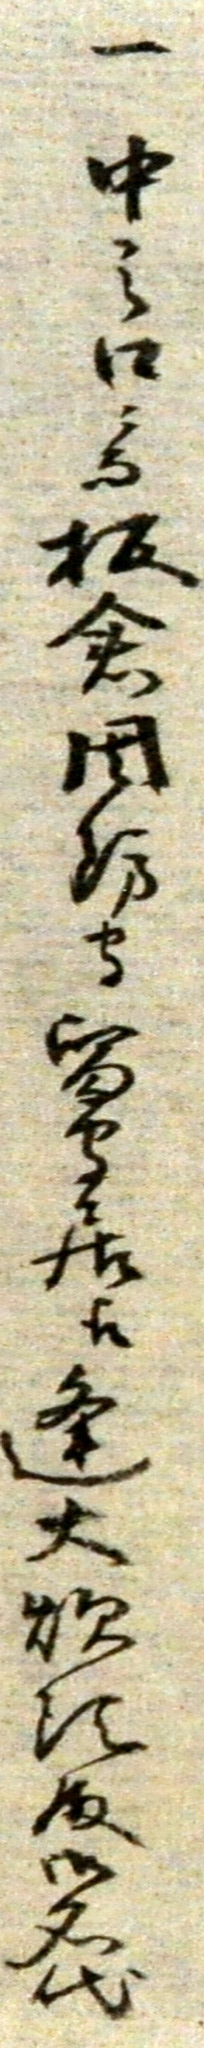一中之口ニ而板倉周防守留守居え逢大炊頭殿御名代

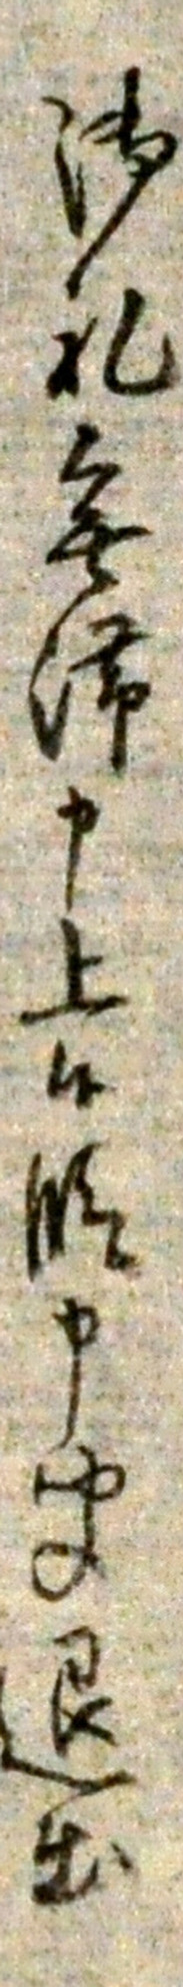御礼無滞申上候段申聞退出
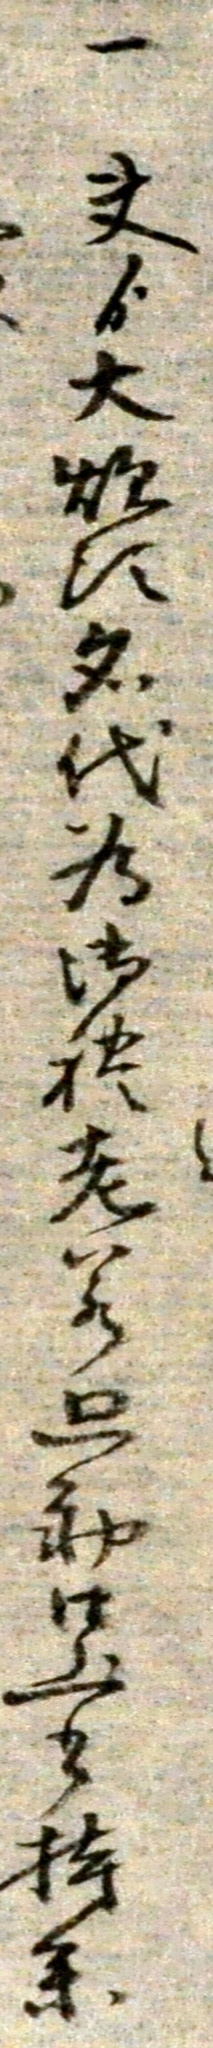一夫ゟ大炊頭名代為御礼老若廻勤口上書持参
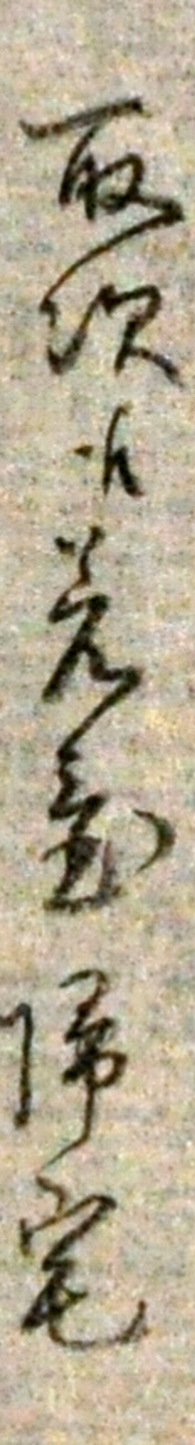取次え差置帰宅

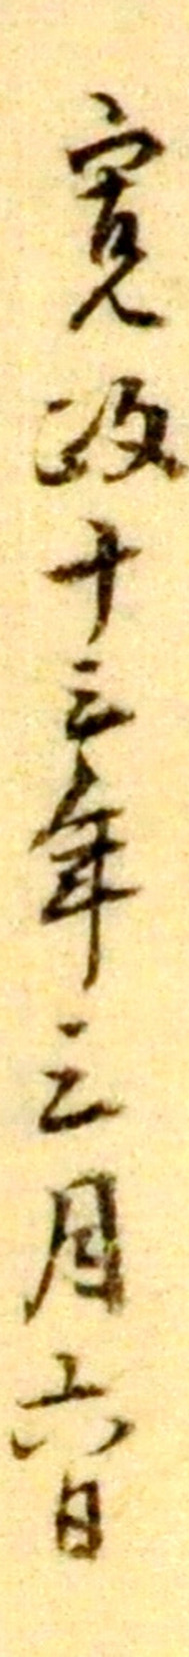寛政十三年三月六日
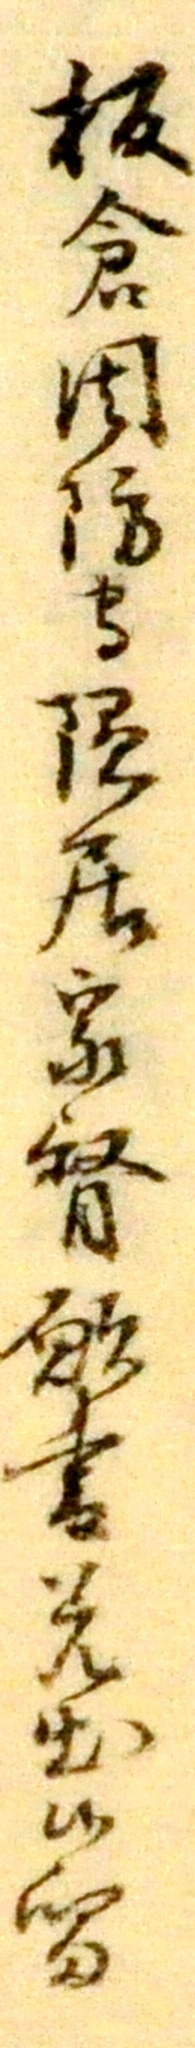板倉周防守隠居家督願書差出候留
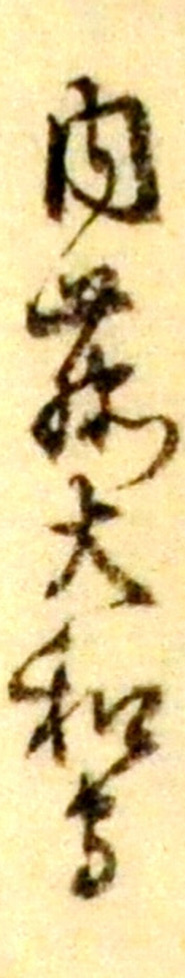内藤大和守
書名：諸名代相勤候節ノ留書外
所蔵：伊那市立高遠町図書館・合同会社AMANE
